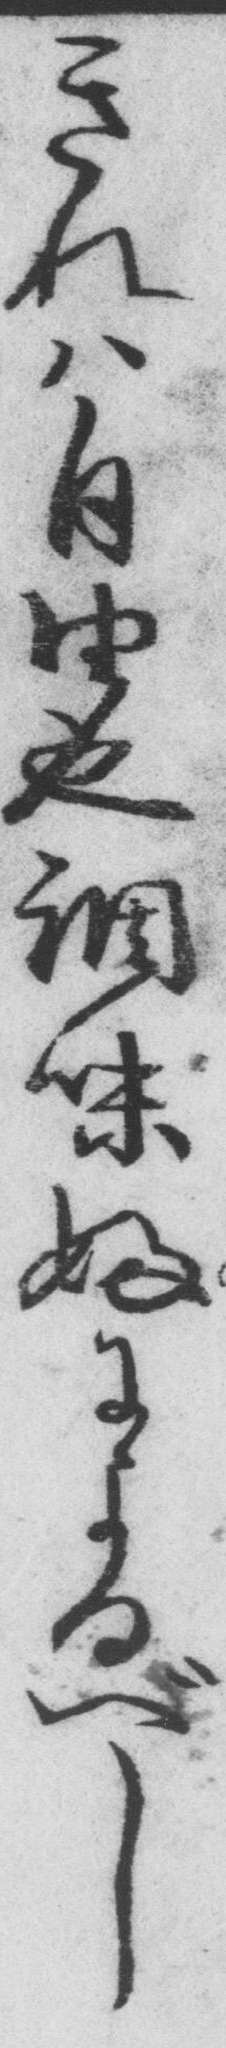きれは自由也調味好によるべし
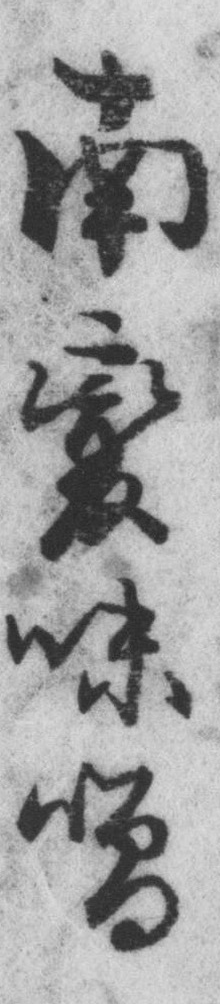南蛮味噌

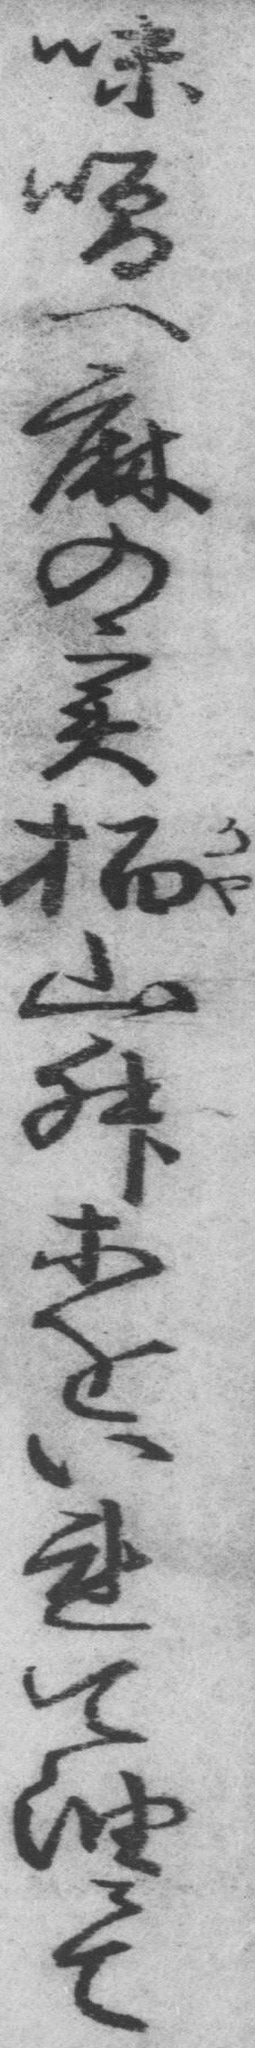味噌へ麻の実栢山升等をいれて油にて
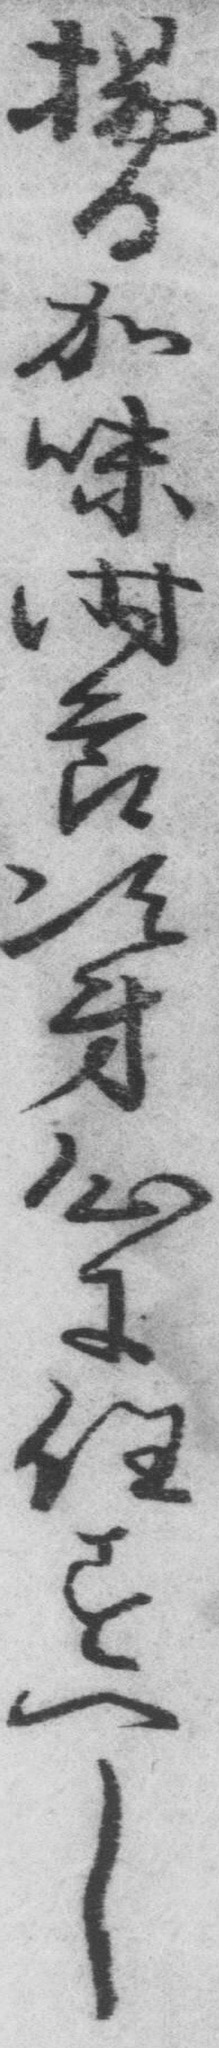揚る加味時節次第心に任すへし
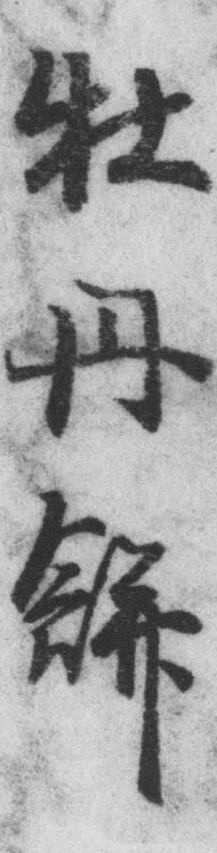牡丹餅
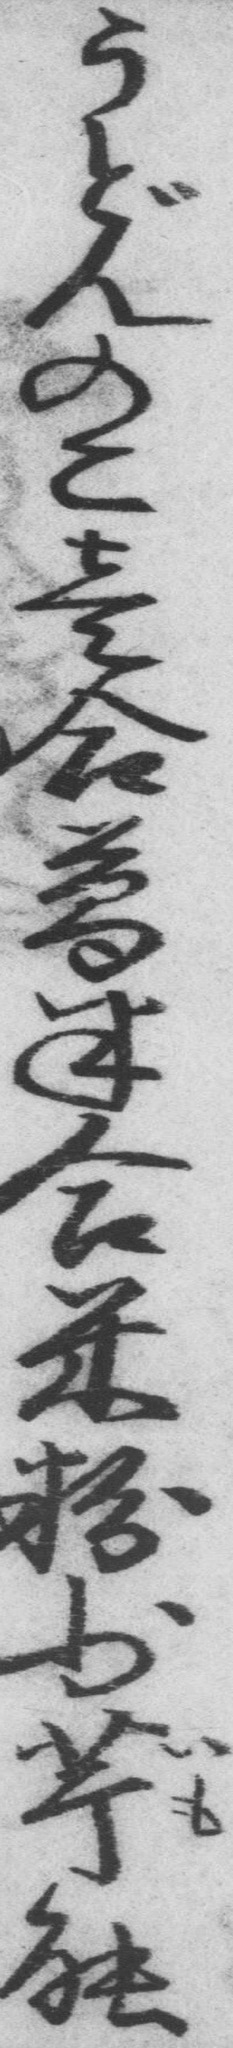うどんのこ壱合葛半合米粉少芋能
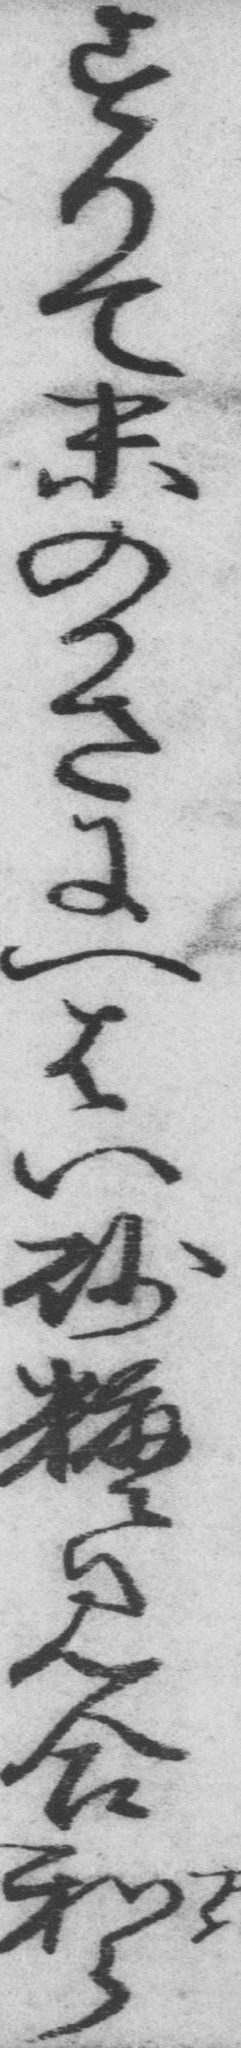すりて米のかさに一はい砂糖に見合和ら
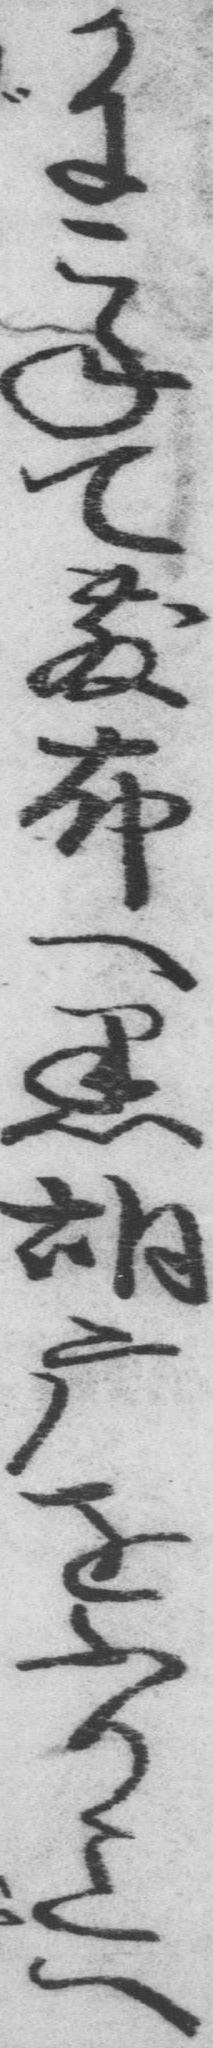かにこねて敷布へ黒胡麻をふり上へ
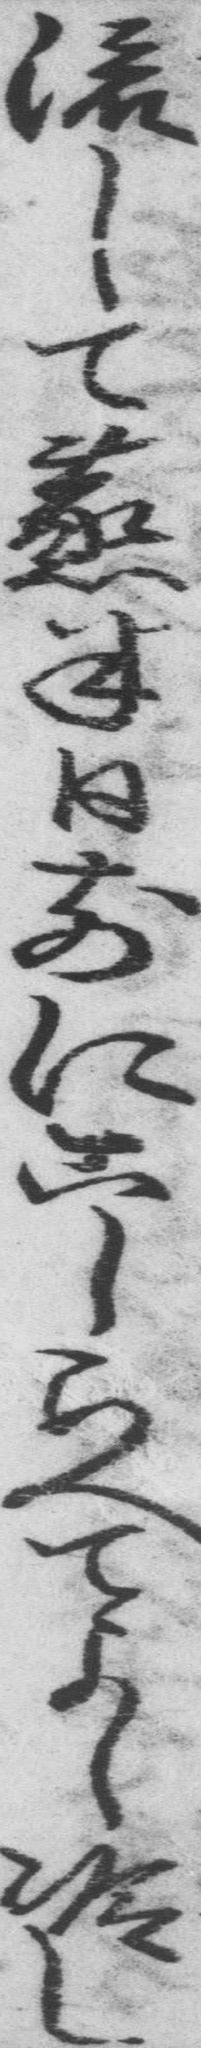流して蒸半日前にこしらへてよし冷し
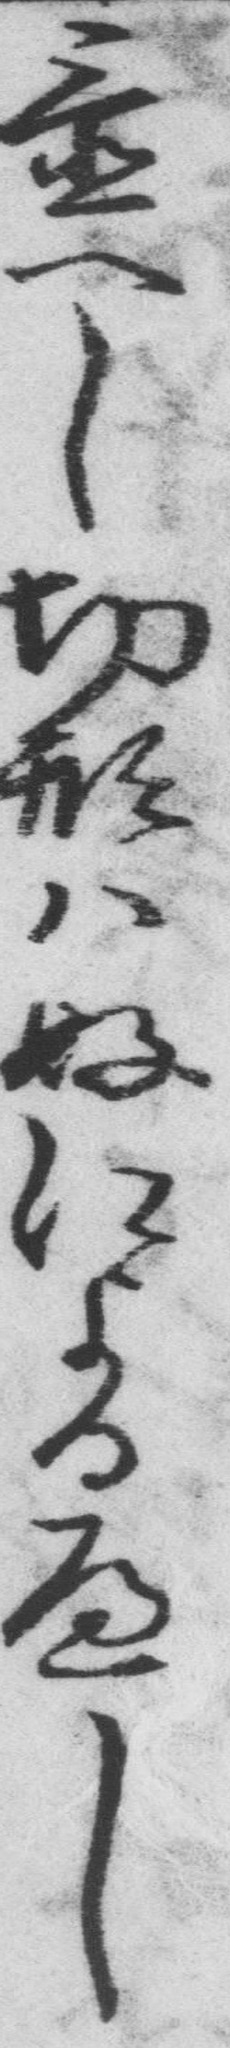置へし切形は好によるへし
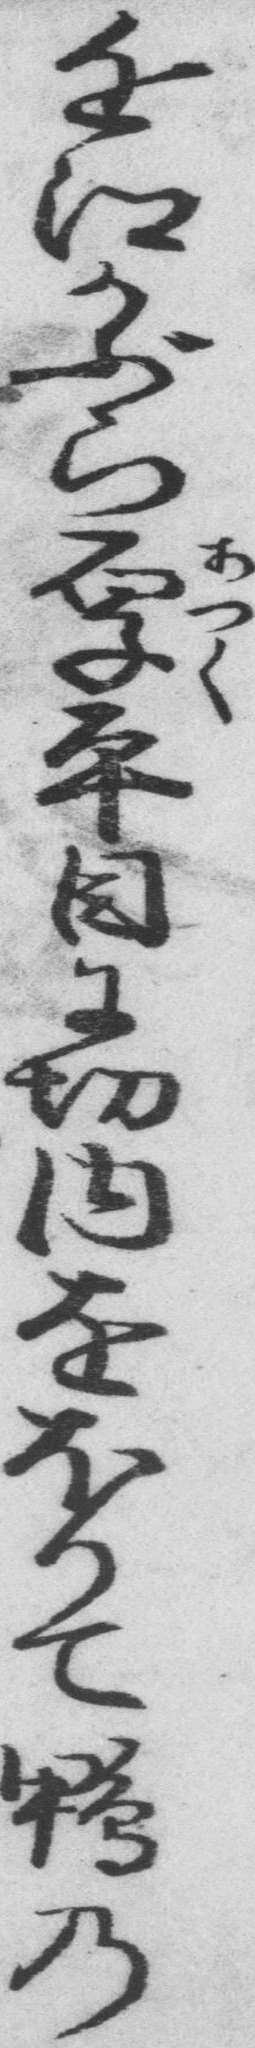近江かぶら厚平目に切内をほりて鴨の
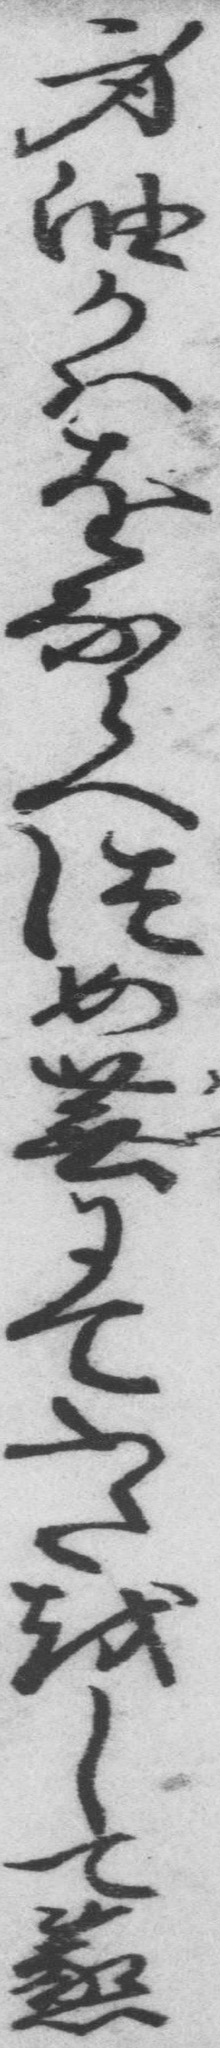身油かはをならへつめ蕪にてふたをして蒸
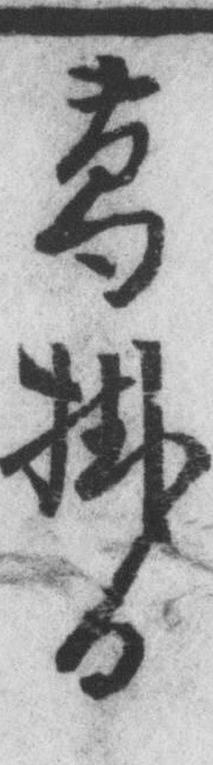葛掛る
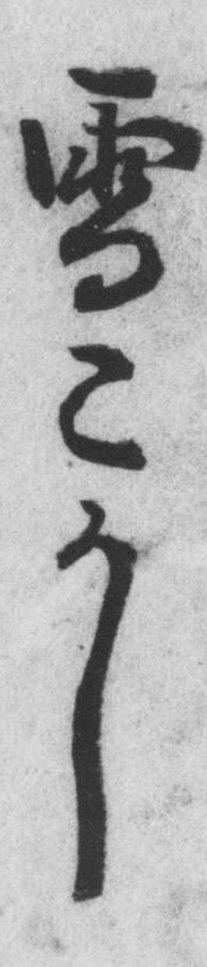雪こかし
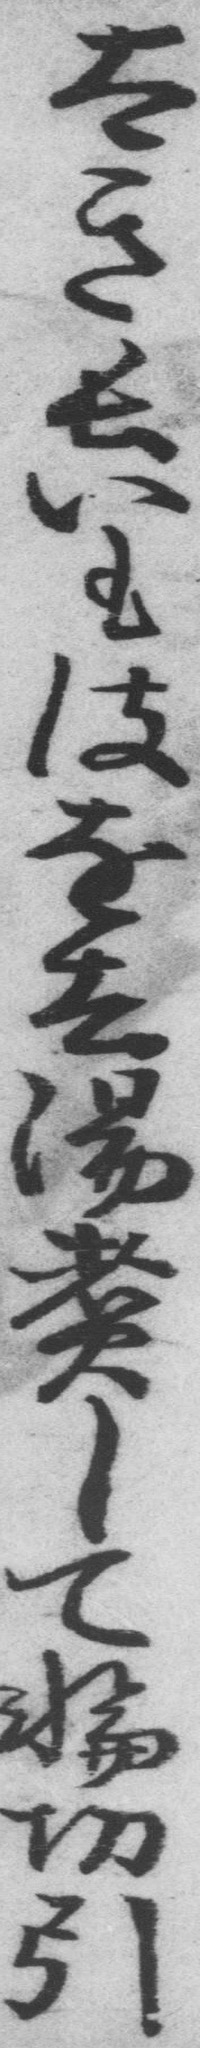太き長いも皮を去湯煮して輪切引
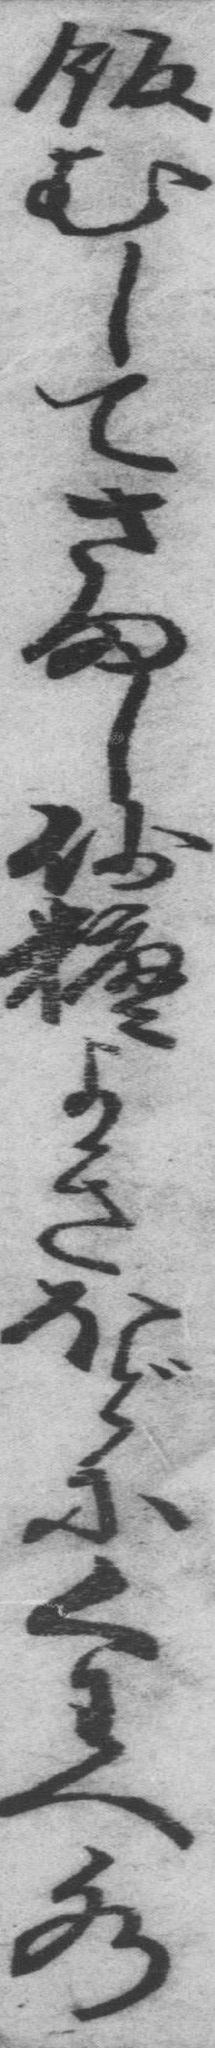飯むしてさまし砂糖よきほどにくわへ水
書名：料理山海郷
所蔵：大阪府立大学学術情報センター 国文学研究資料館
